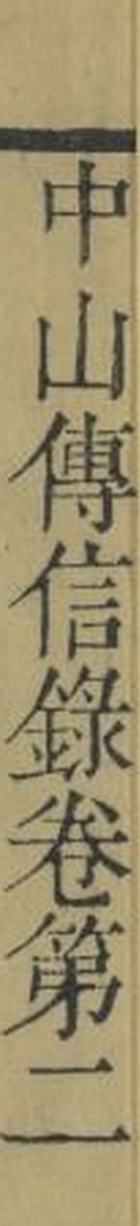中山傳信錄卷第二
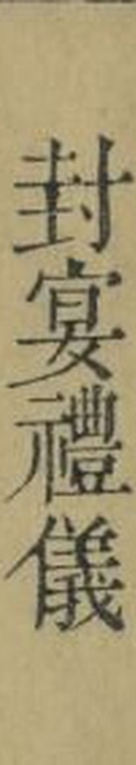封宴禮儀
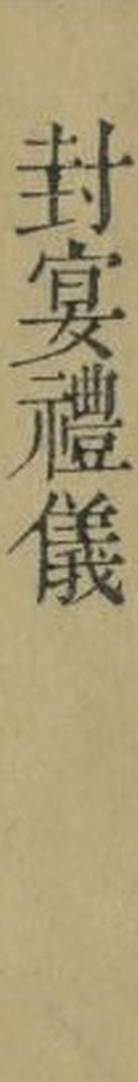封宴禮儀
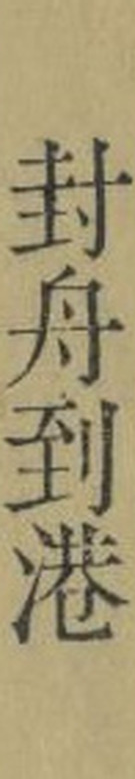封舟到港
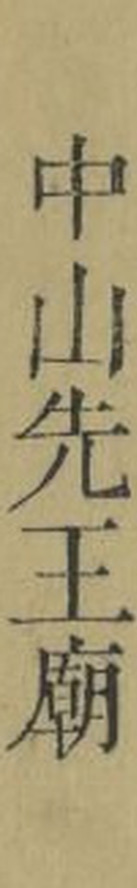中山先王廟
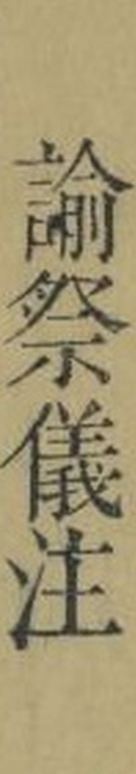諭祭儀注
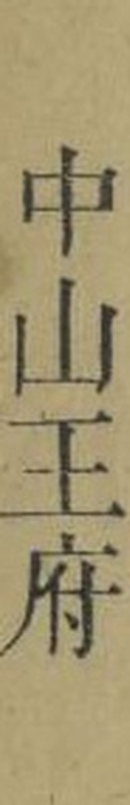中山王府

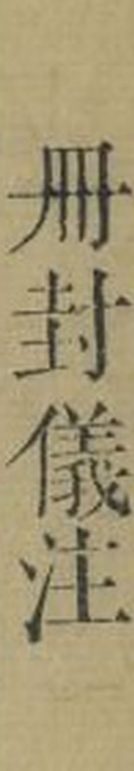冊封儀注
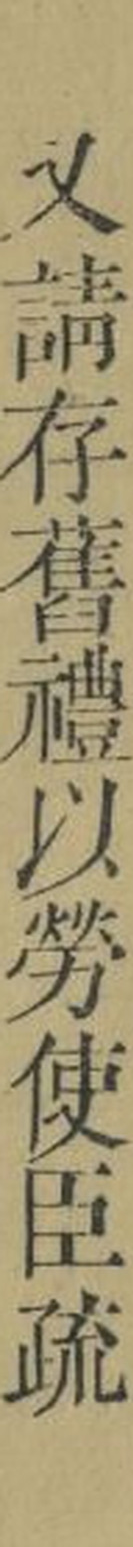又請存舊禮以勞使臣疏
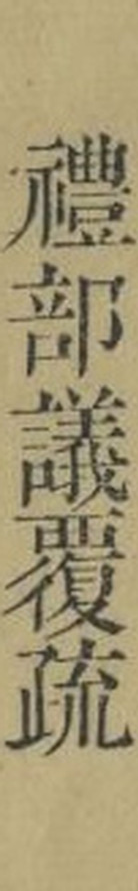禮部議覆疏
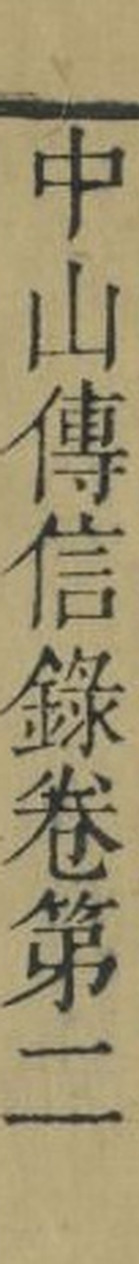中山傳信錄卷第二
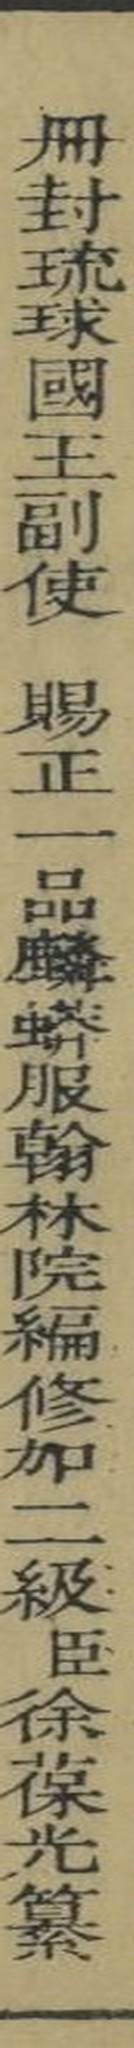冊封琉球國王副使賜正一品麟蟒服翰林院編修加二級臣徐葆光纂
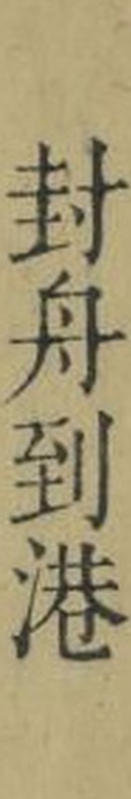封舟到港
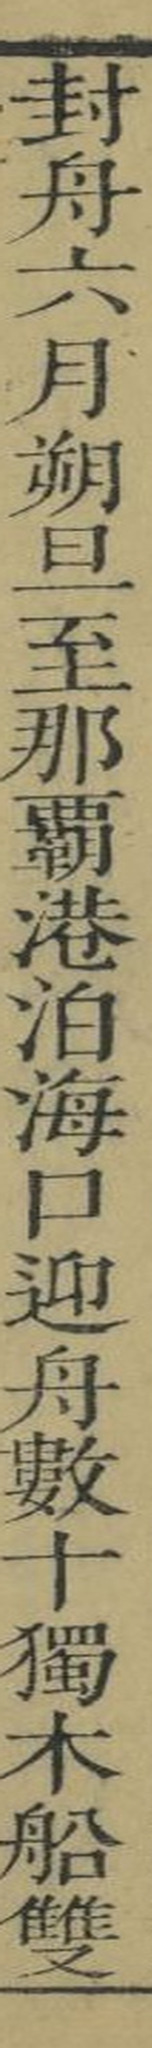封舟六月朔旦至那覇港泊海口迎舟數十獨木船雙
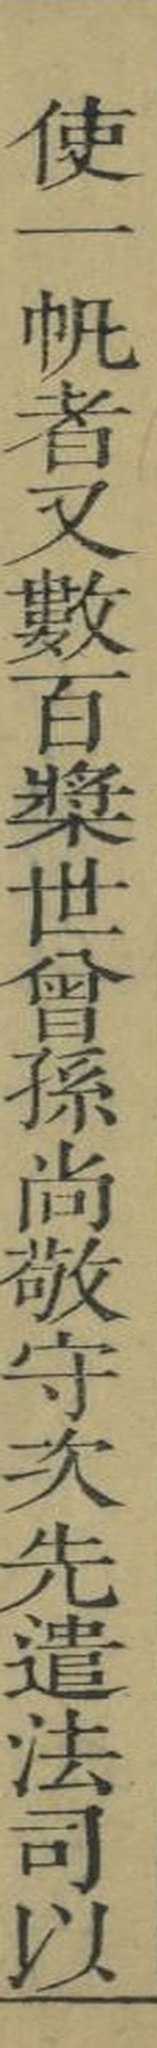使一帆者又數百槳世曾孫尚敬守次先遣法司以
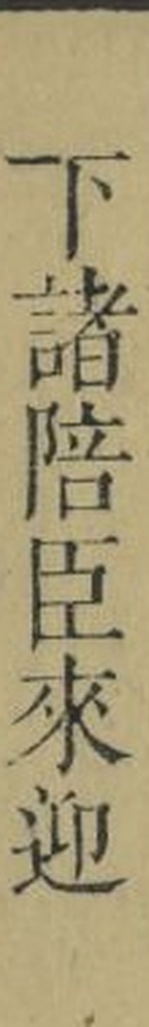下諸陪臣來迎
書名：中山伝信録 巻二
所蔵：University of the Ryukyus Library
